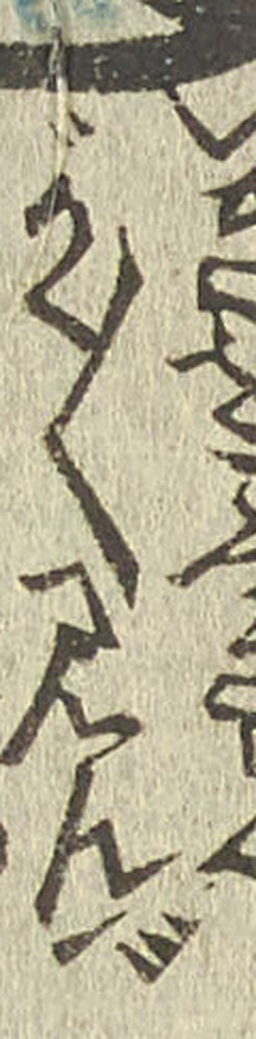よく〳〵見れば
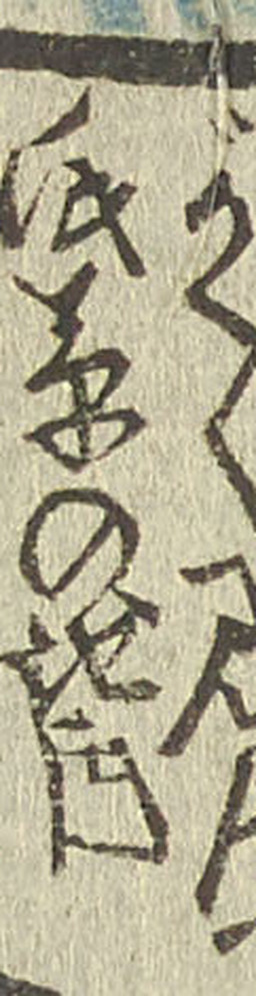浅草の地内
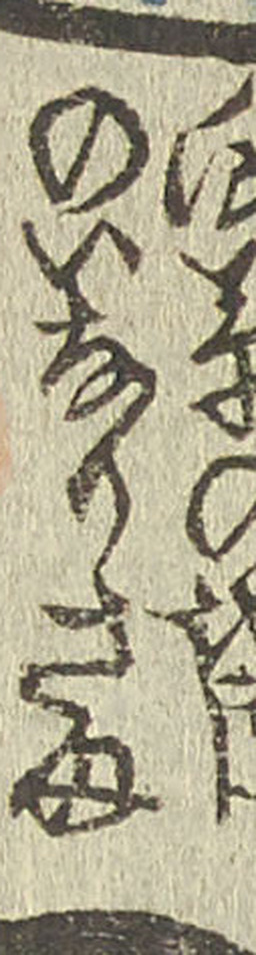のいなりさま
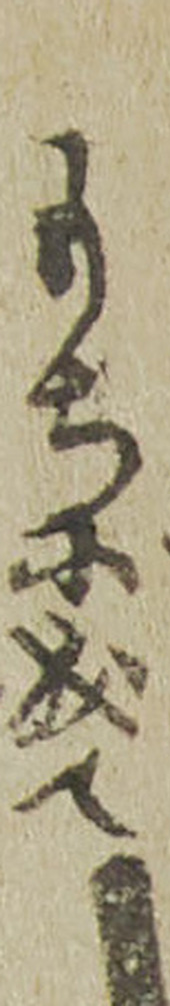もちに成て
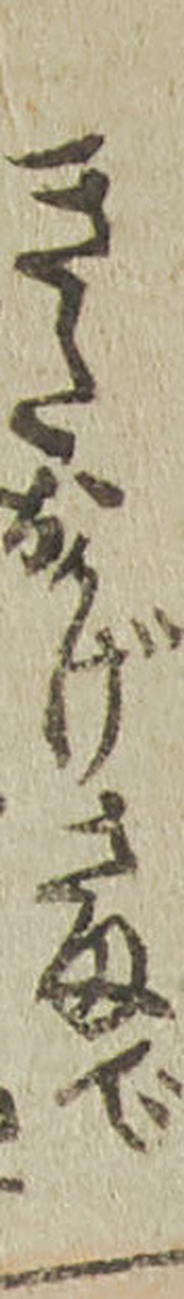きたおかげさまで
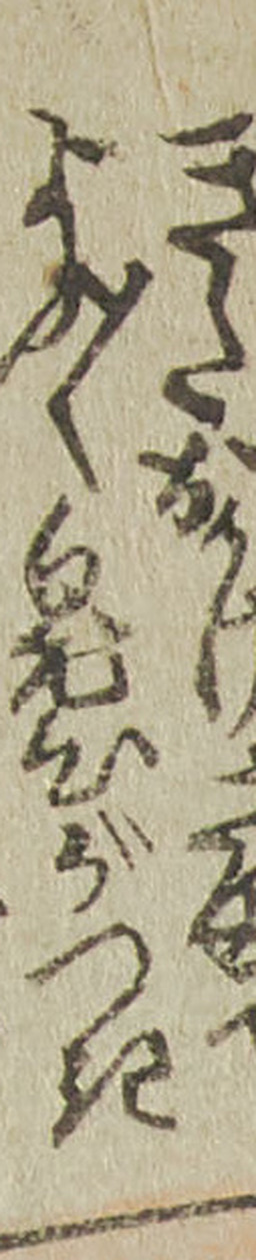よふ〳〵鬼心がつき
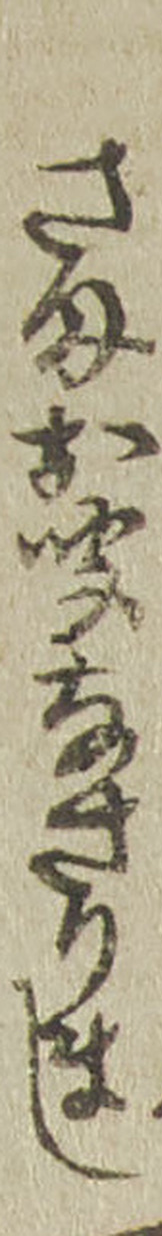さまお聞なさりまし
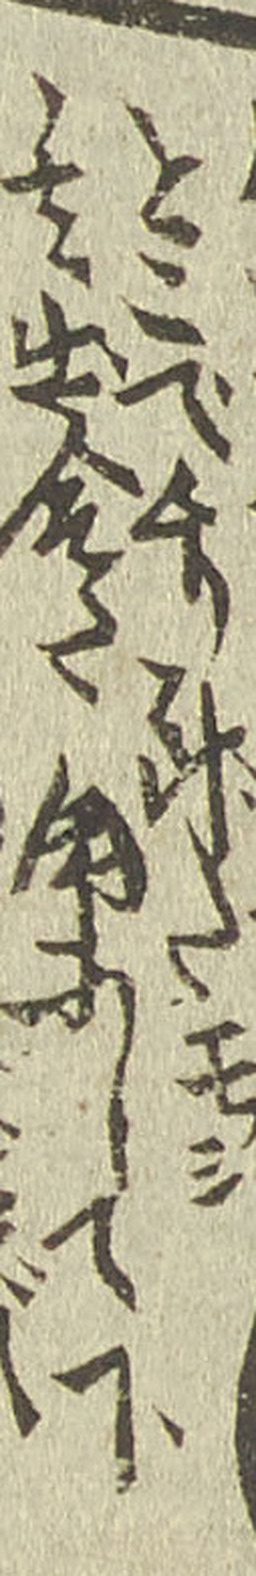其出合た角にして下
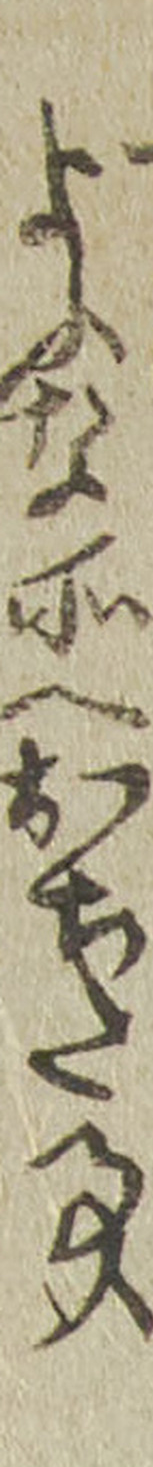よふな所へおちた事は
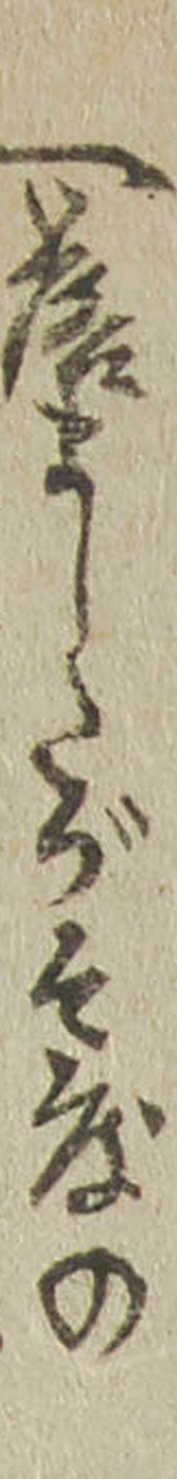一落ましたが今度の
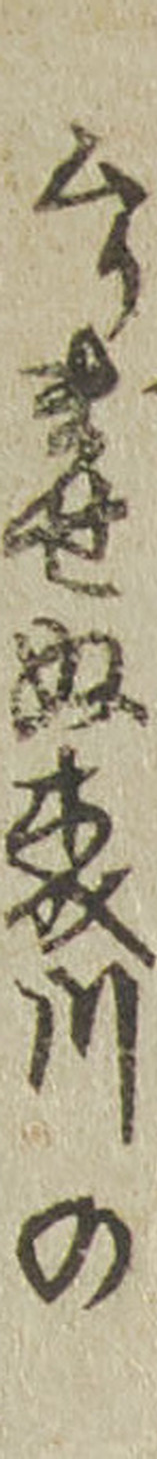ござりませぬ森川の
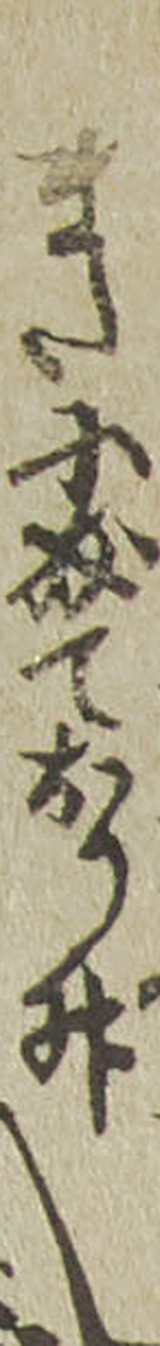またに成ており升
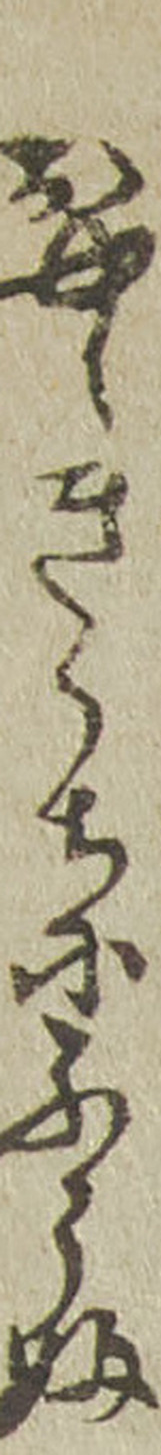おやしきうちにふう婦
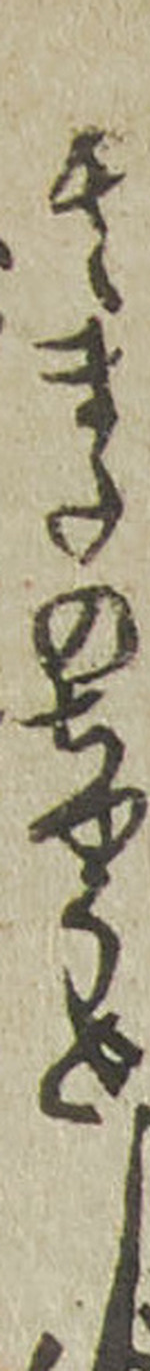其またのちやうど
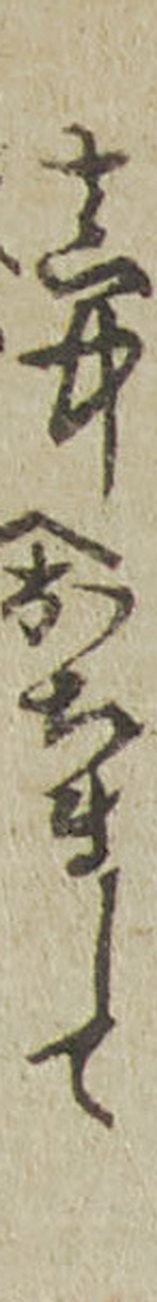真中へおちまして
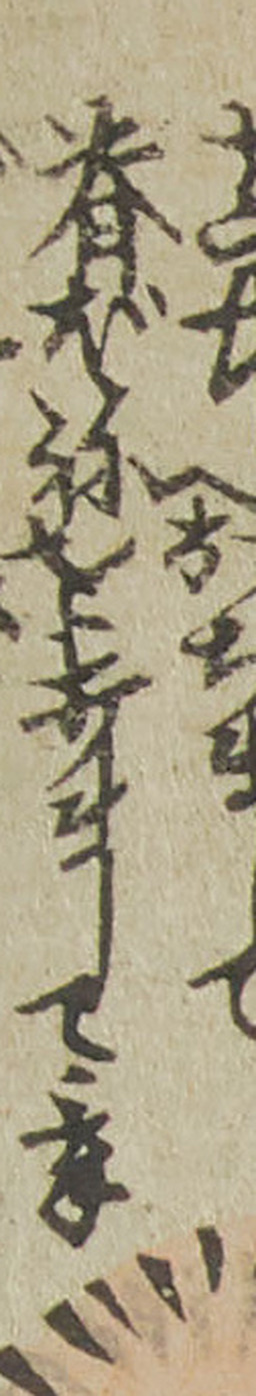背ぼねを打まして気
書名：[外科骨折泥鏝療治]
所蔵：東京大学総合図書館 General Library in the University of Tokyo, JAPAN
